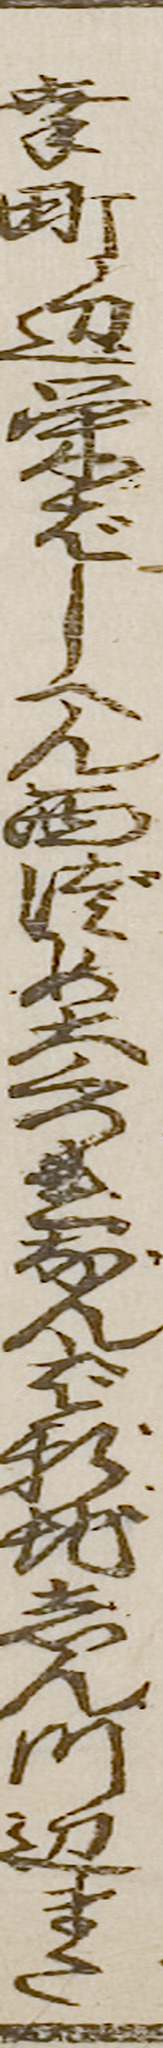幸町の辺栄ばしへん西ずめ大くつれなんば新地しん川辺また
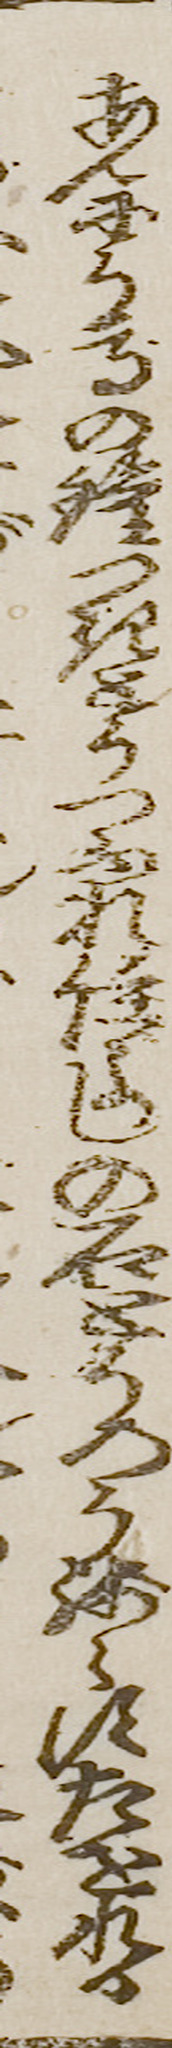あんにう寺の鐘つきとうつふれ住よしの石とうろう残らすたをれる
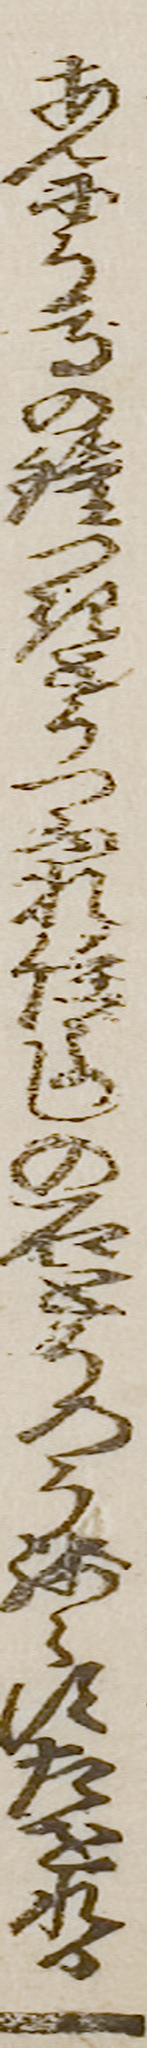あんにう寺の鐘つきとうつふれ住よしの石とうろう残らすたをれる
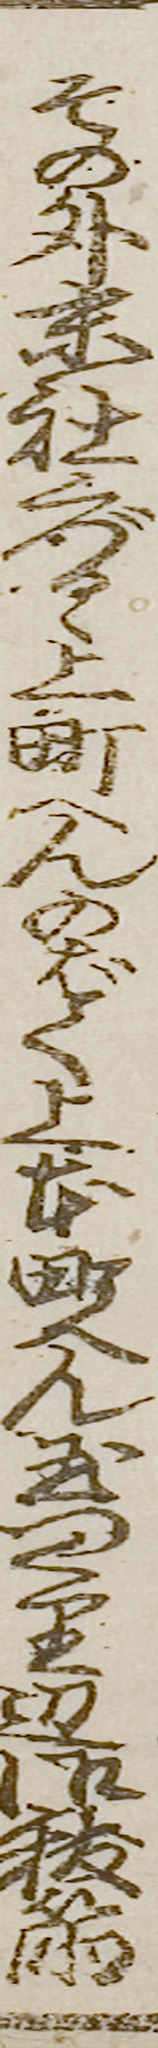その外末社くづるゝ上町へんのばく上本町へん玉つくり辺御祓い所
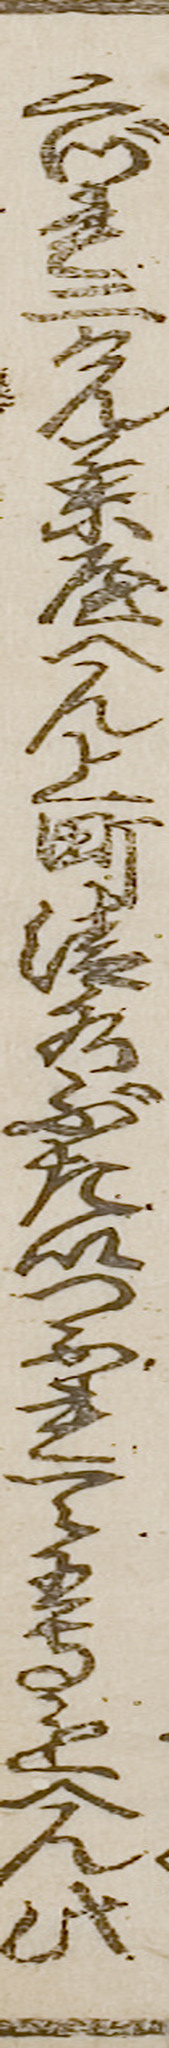くづれ二けん茶屋へん上町清水ぶたいつふれ天王寺近へん此
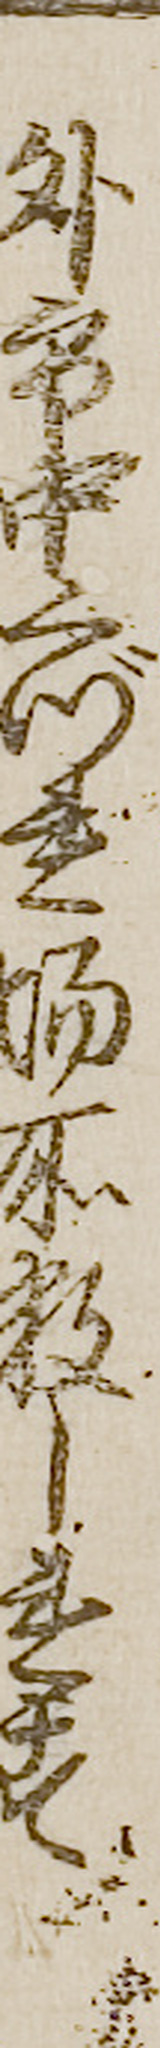外市中くづれ場所数しれす
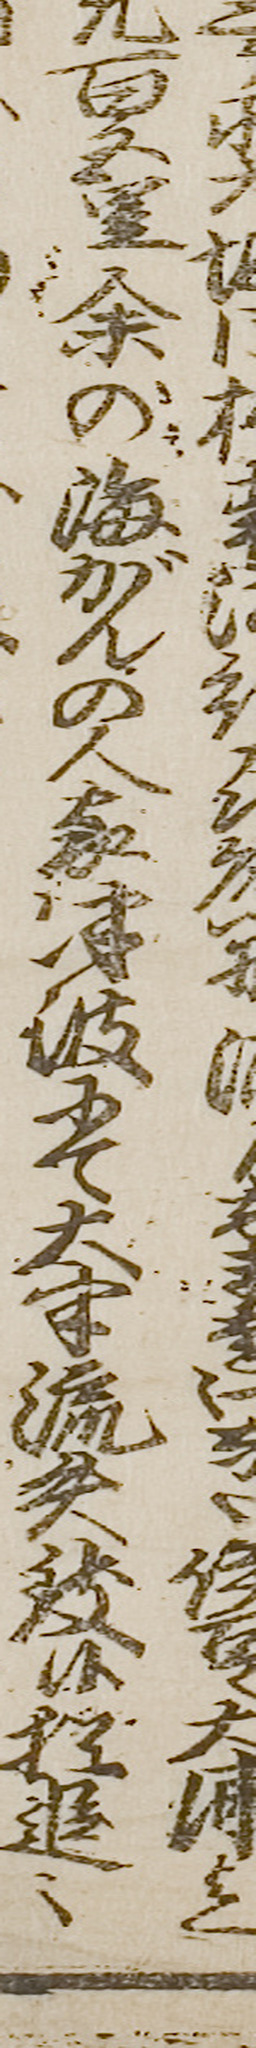凡百五里余の海がんの人家津波にて大半流失致候猶追々
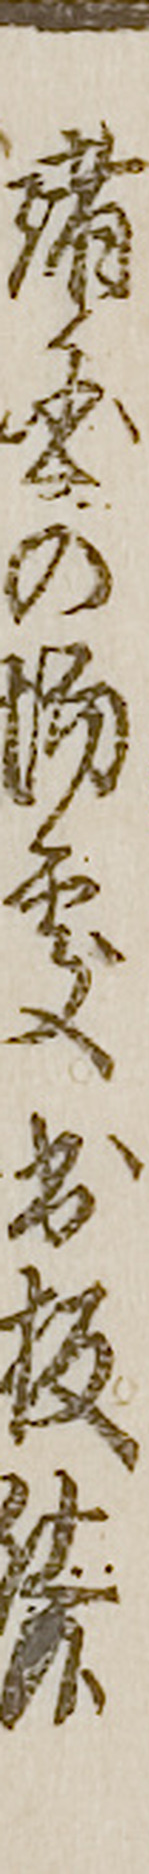諸国の場處出板仕候
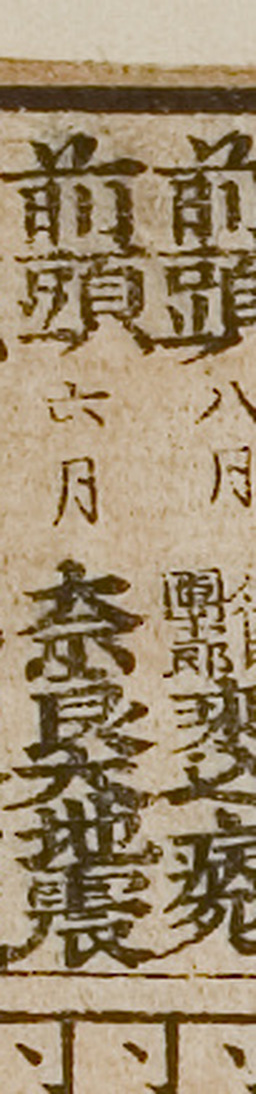前頭六月奈良大地震
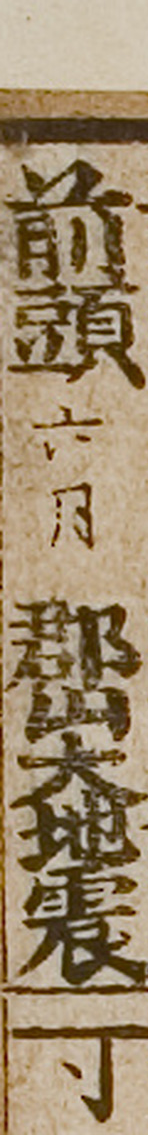前頭六月郡山大地震
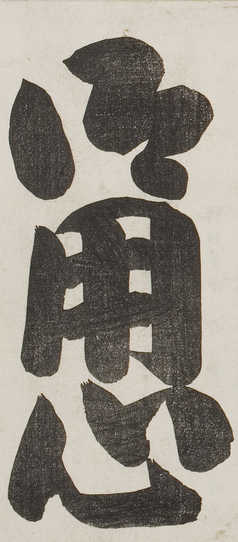御用心
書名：大地震大津浪一口ばなし
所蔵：東京大学総合図書館 General Library in the University of Tokyo, JAPAN
